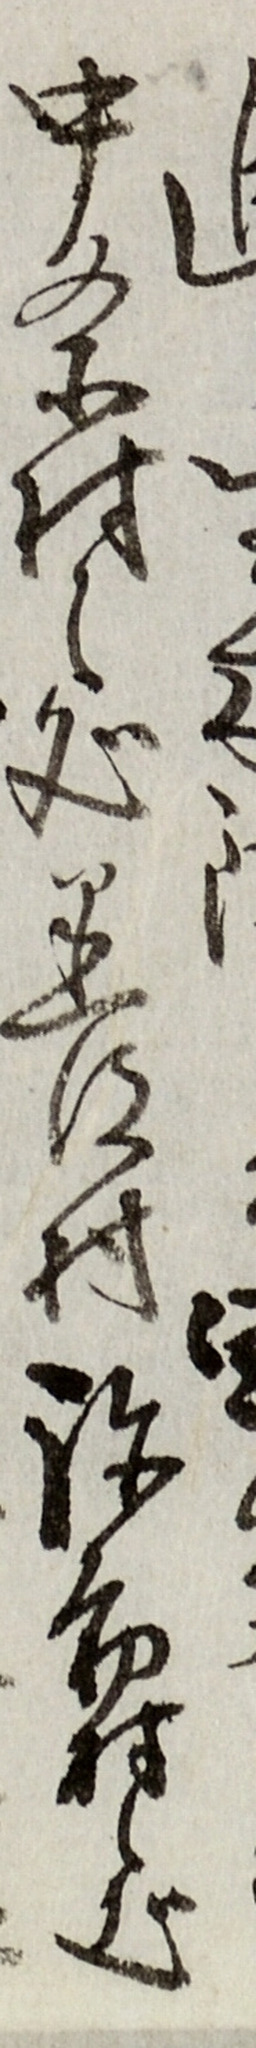中条村之処黒沢村弥勒村之処
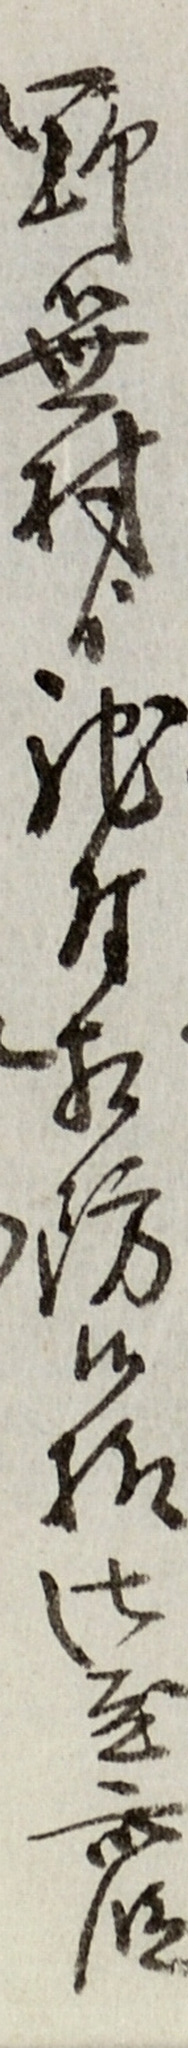野笹村ゟ馳付相防候様仕度此段
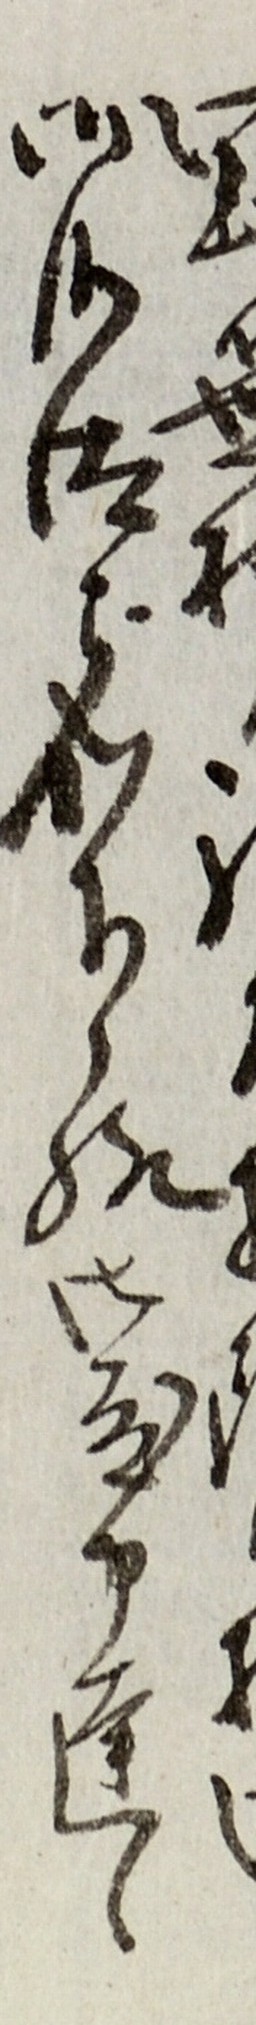御沙汰被成下候様此度申達候
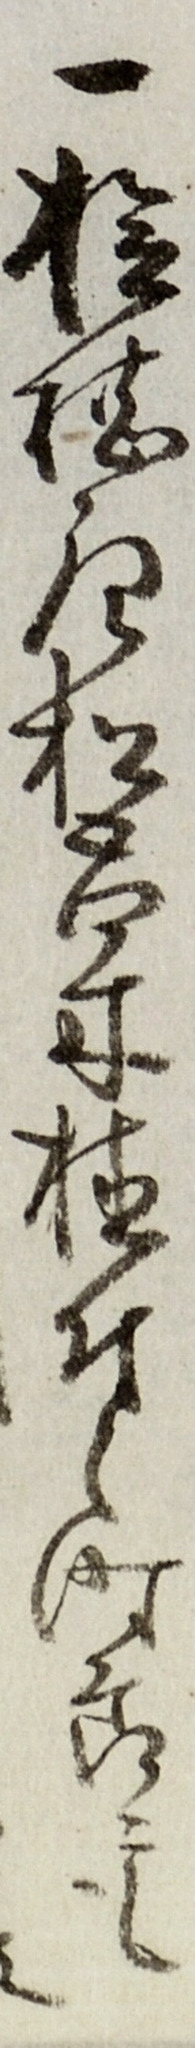一桧椹唐松苗木植付之時節ニも
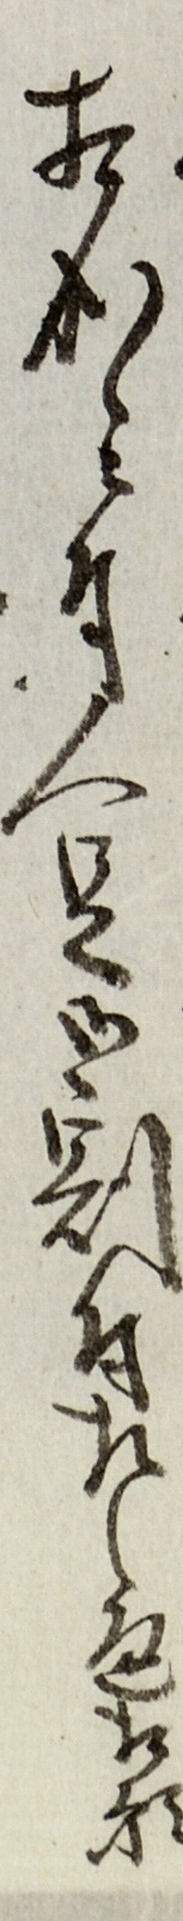相成候ニ付人足御割付左之通相願
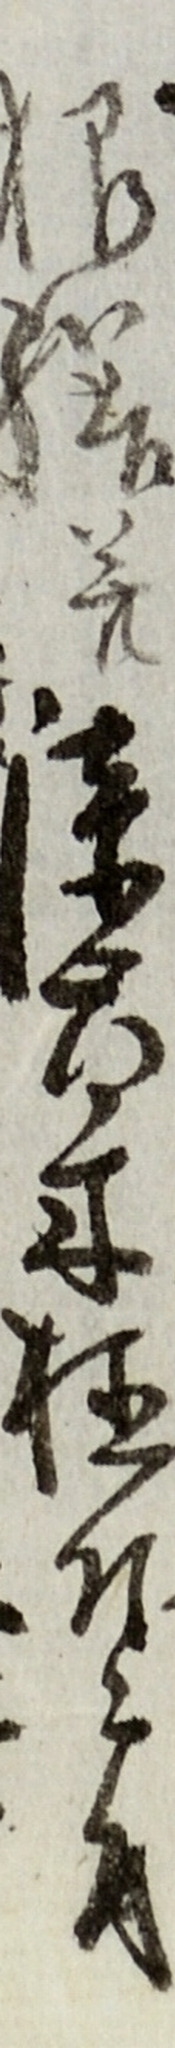根繕并漆苗木植付ニ付
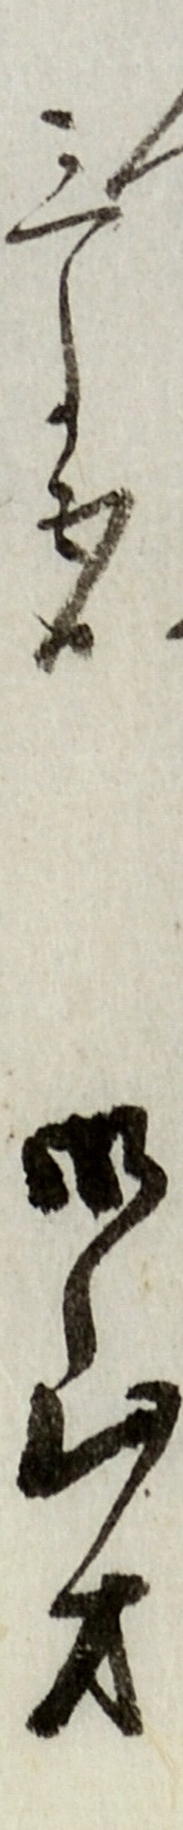三月五日御山方
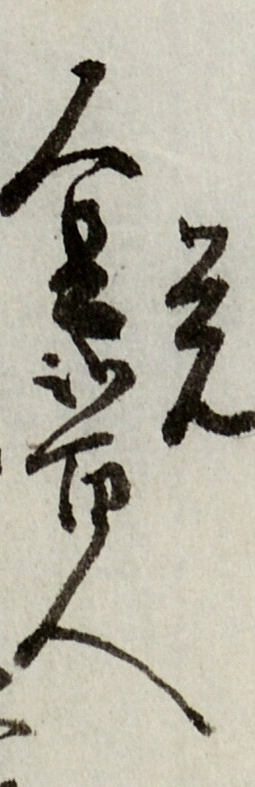人足弐百人
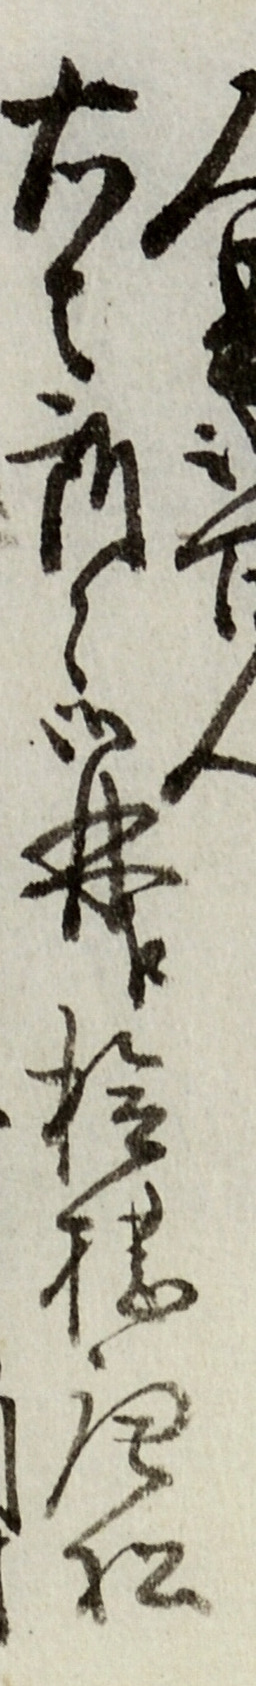右者所々御林江桧椹唐松
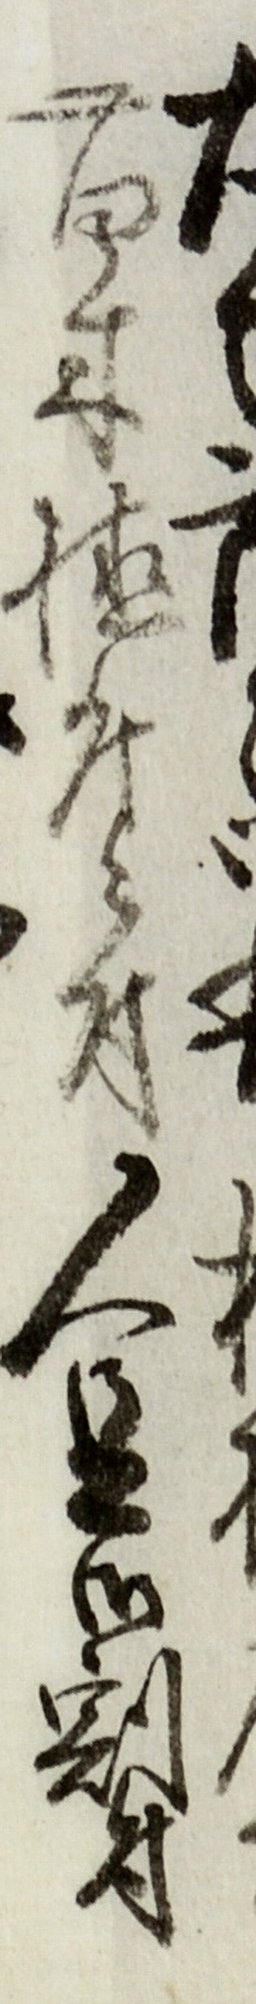苗木植付ニ付人足御割付
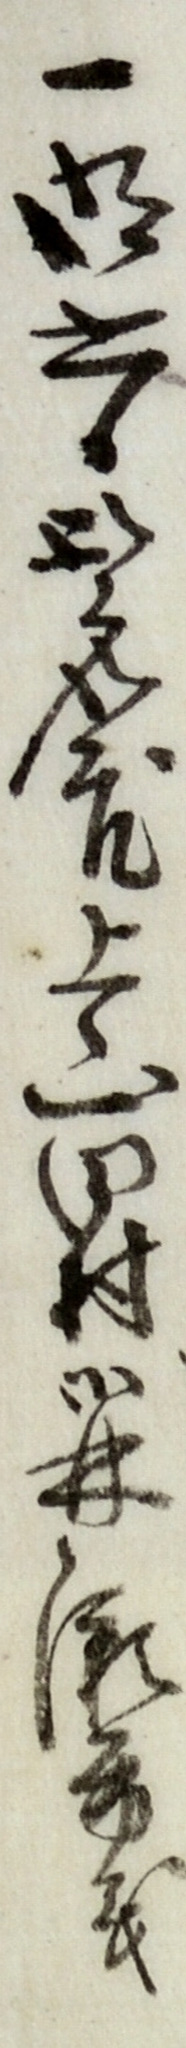一明六日麗蔵上山田村御林瀬市義
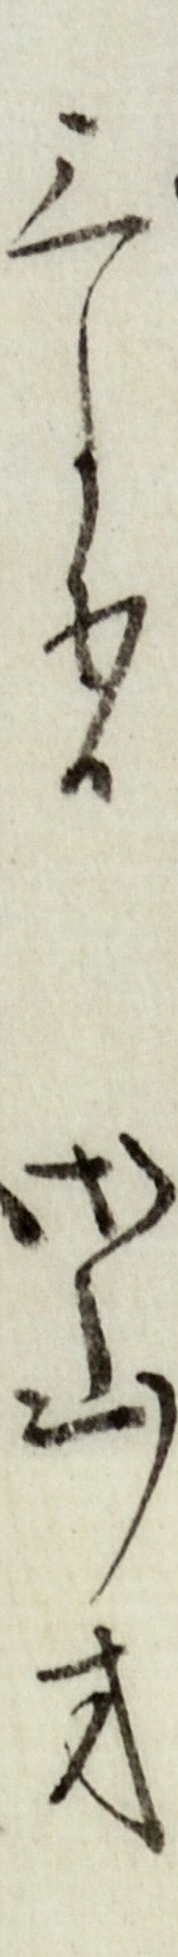三月五日御山方

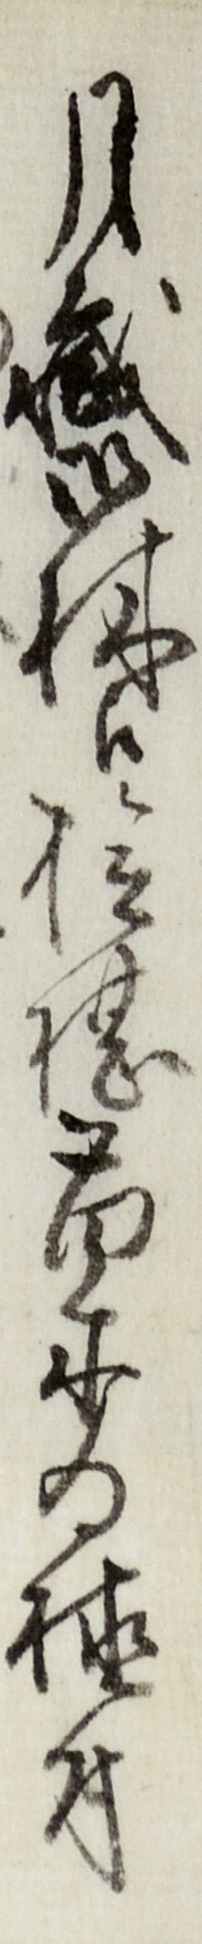月蔵御林江桧椹苗木為植付
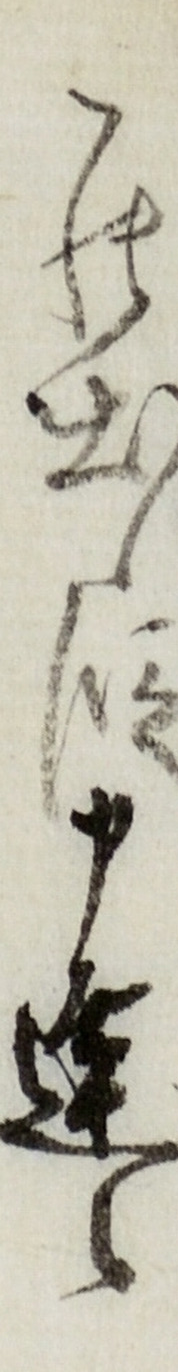罷出候段申達度
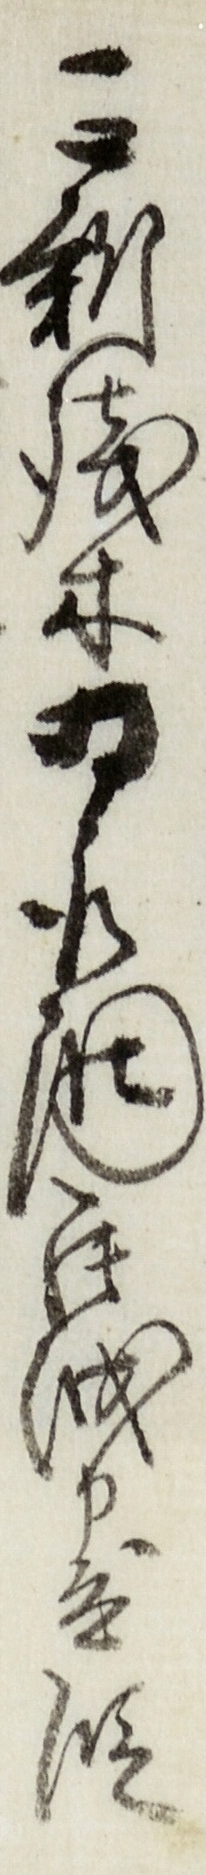一薪残木為取調罷越申度段
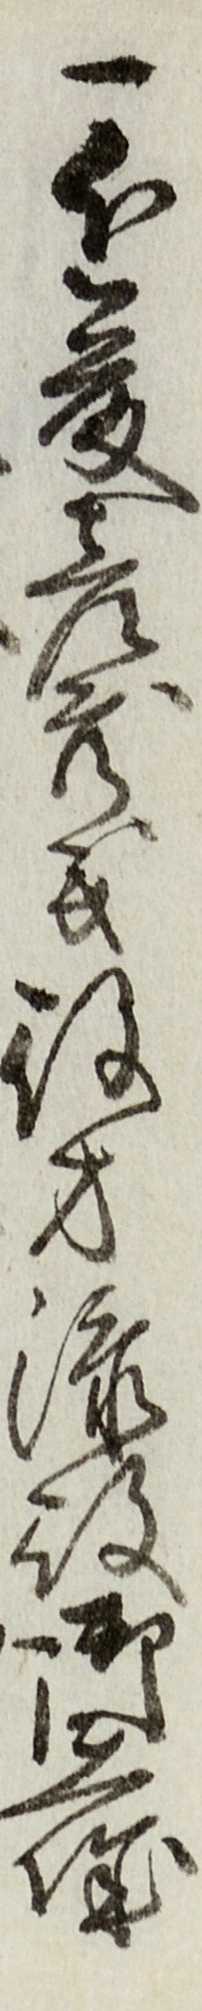一近藤彦蔵義役方添役御在城
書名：御山方御薪方諸事御用留
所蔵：伊那市立高遠町図書館・合同会社AMANE
